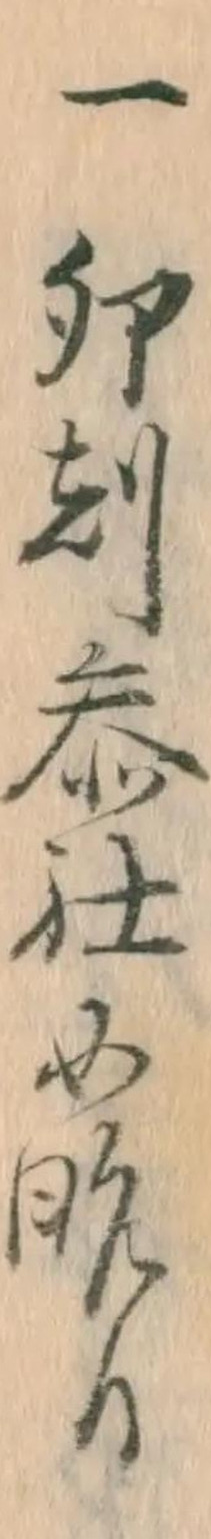一卯刻参社如昨日
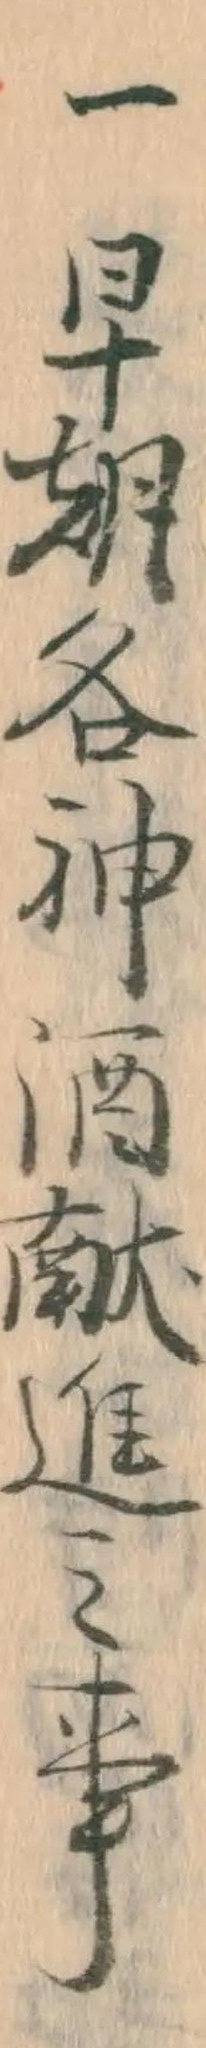一早朝各神酒献之事
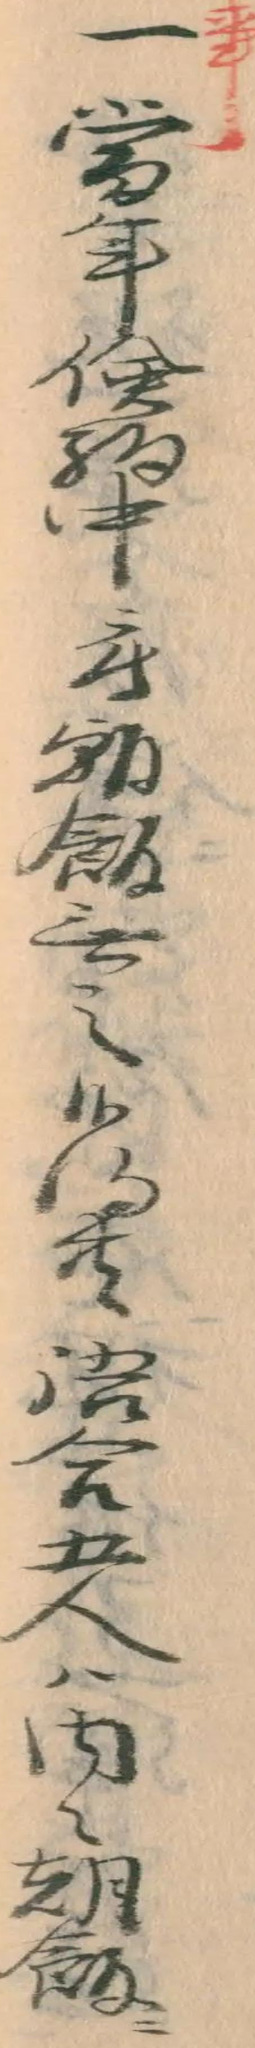一當年倹約中ニ付朝飯無之候得共語合五人ハ内々朝飯ニ
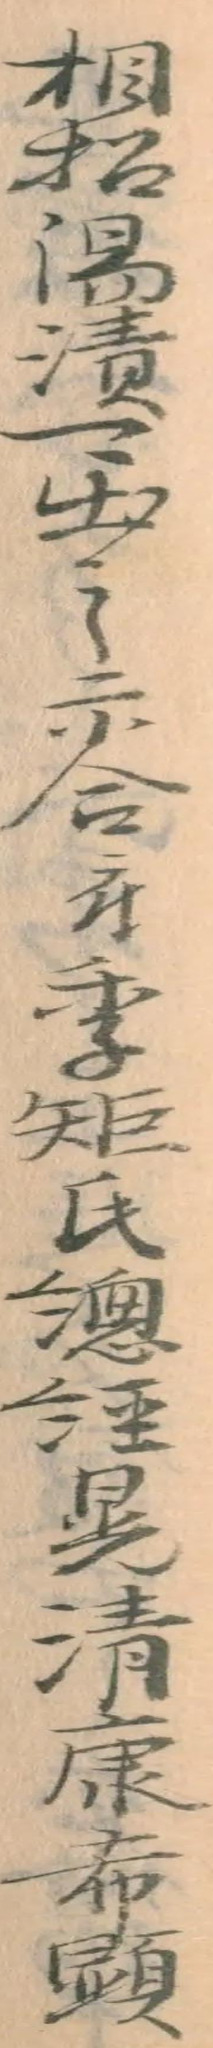相招湯漬可出之示合ニ付季矩氏總経晃清康希顕
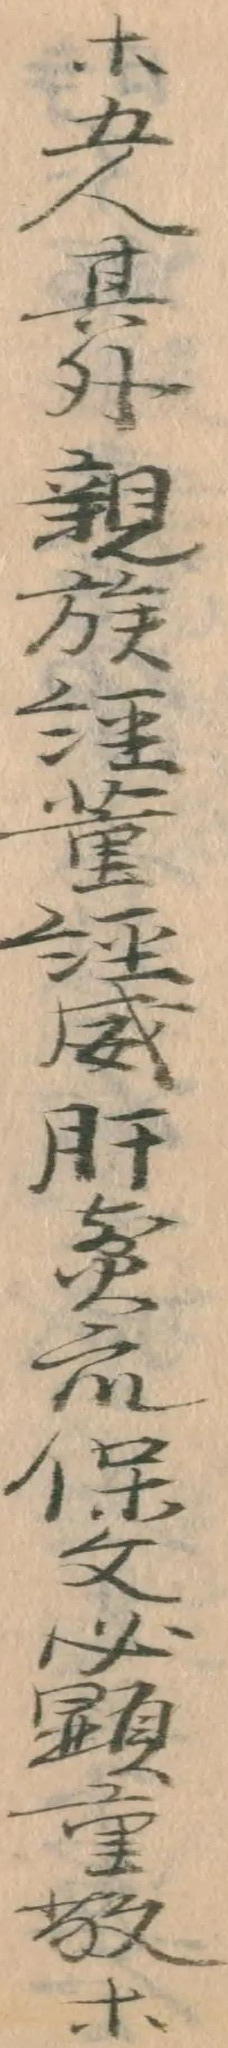等五人其外親族経董経威肝煎衆保文必顕重敬等
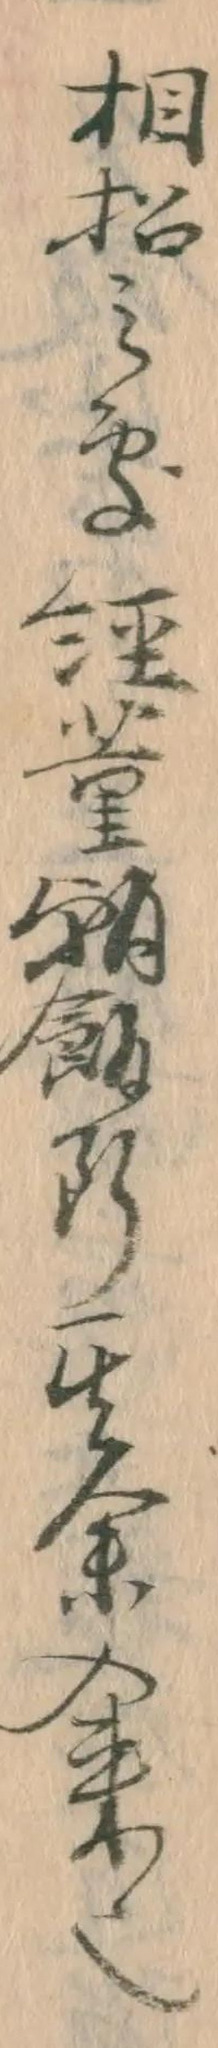相招之處経董朝飯断其余入来也
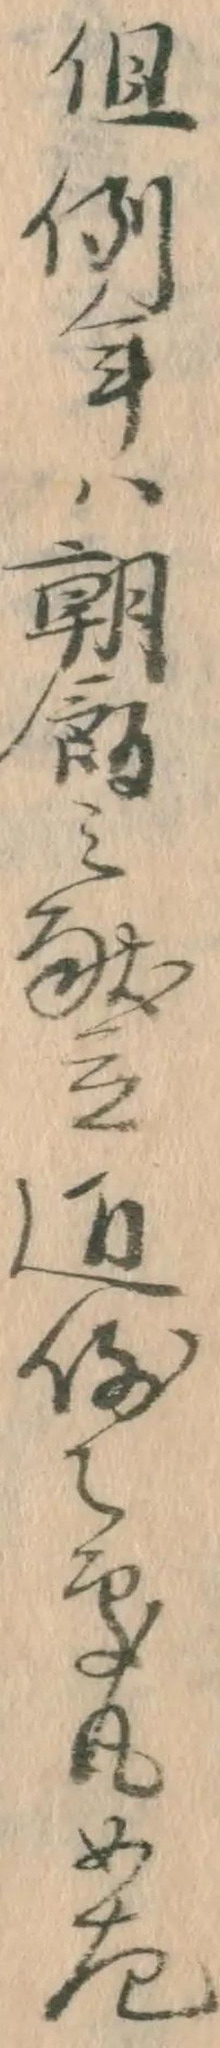但例年ハ朝飯之献立近例之處凡如左

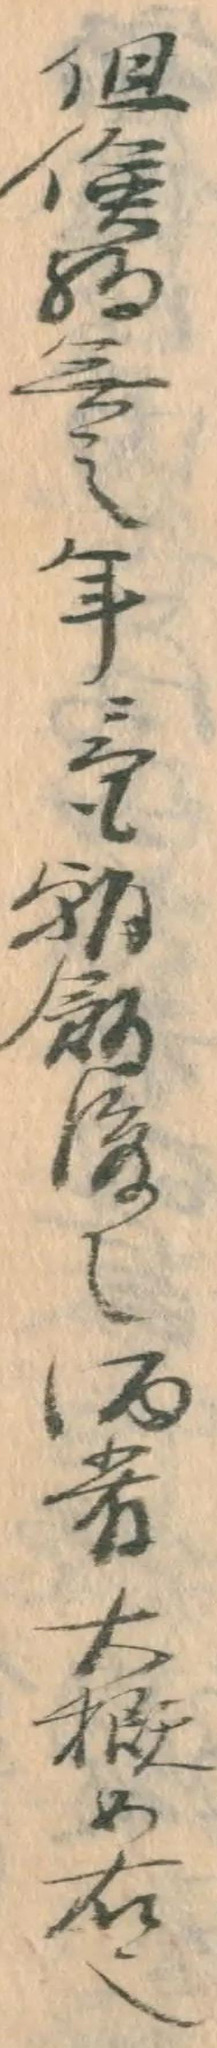但倹約無之年ニ而も朝飯後之酒肴右様大概如右也
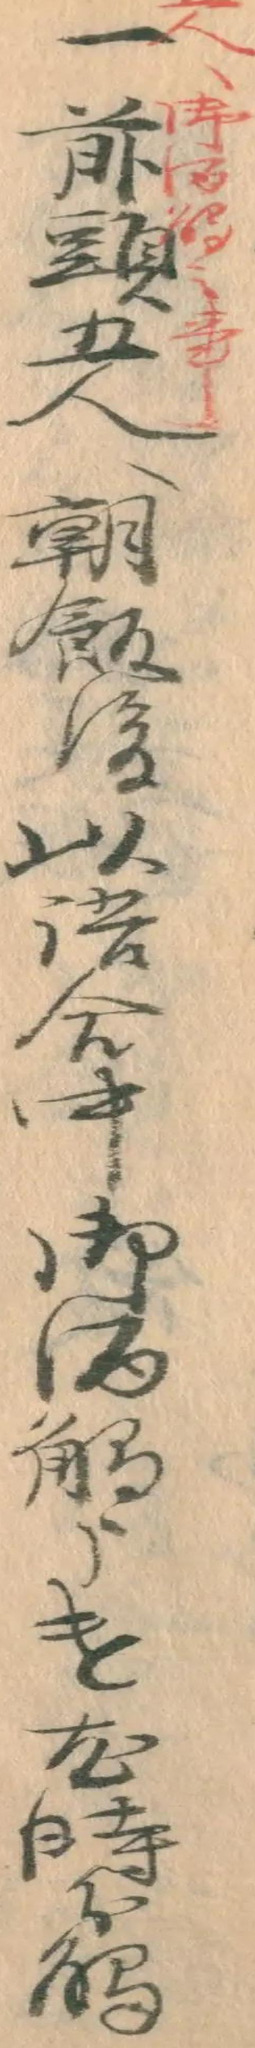一前頭五人へ朝飯後以語合中御酒触申遣尤時分触
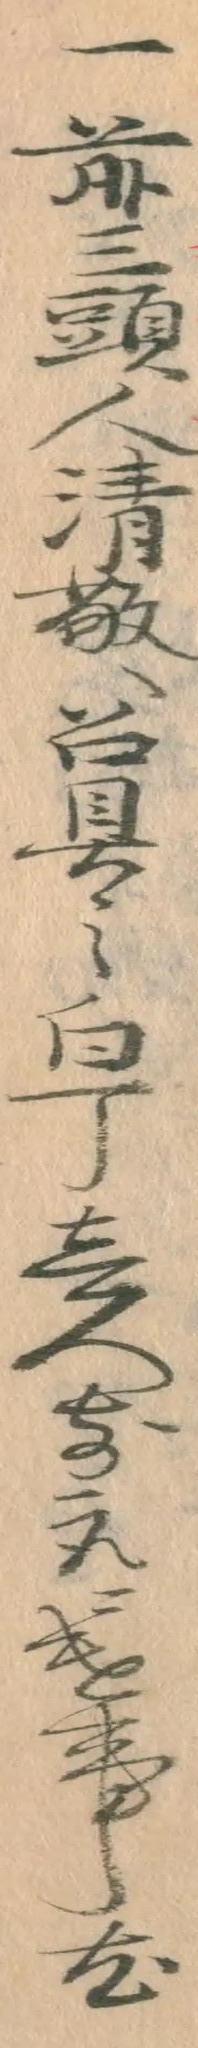一前三頭人清敬へ召具之白丁壱人前取ニ遣事尤
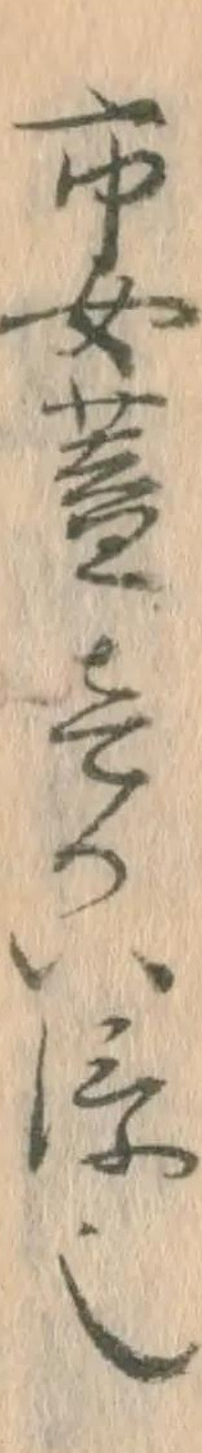市女蓋壱かい添也
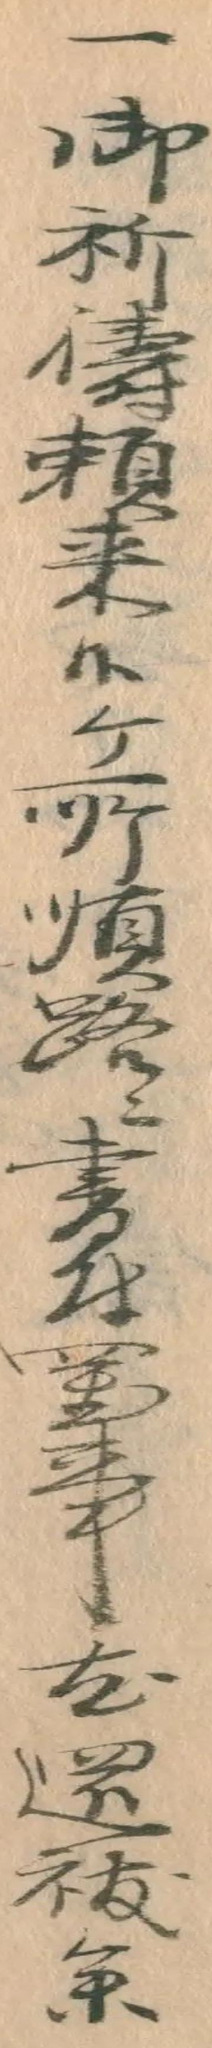一御祈祷頼来候ケ所順路ニ書付置事尤還祓参
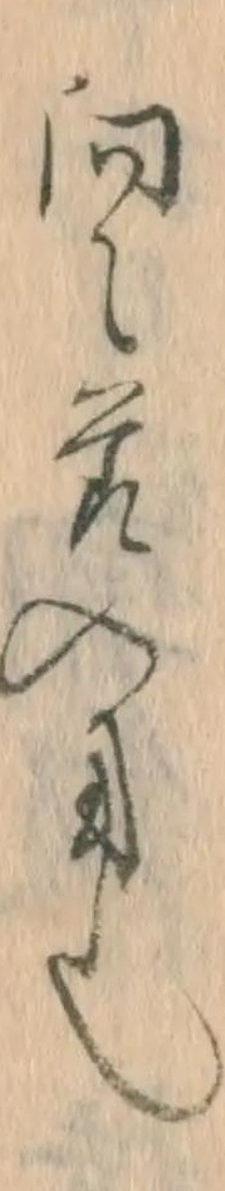向之節入用也
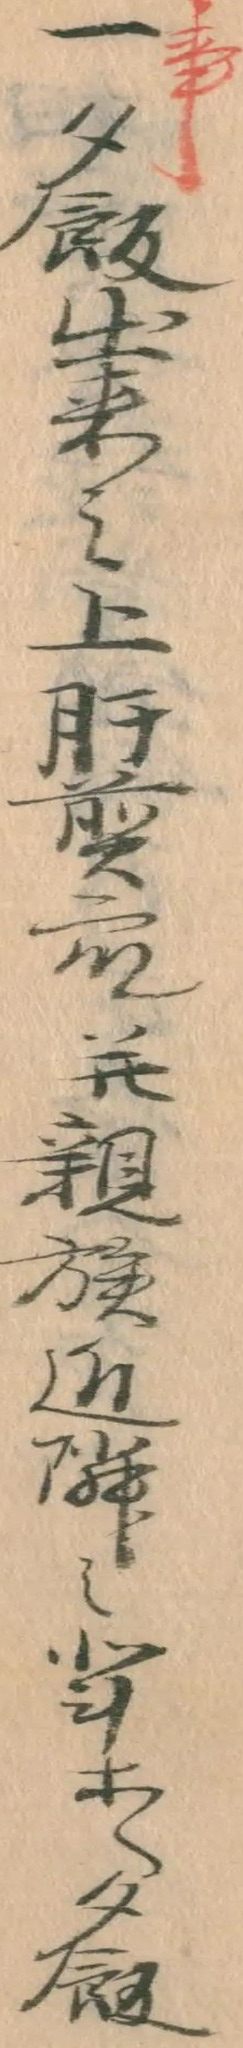一夕飯出来之上肝煎衆并親族近隣之輩等へ夕飯
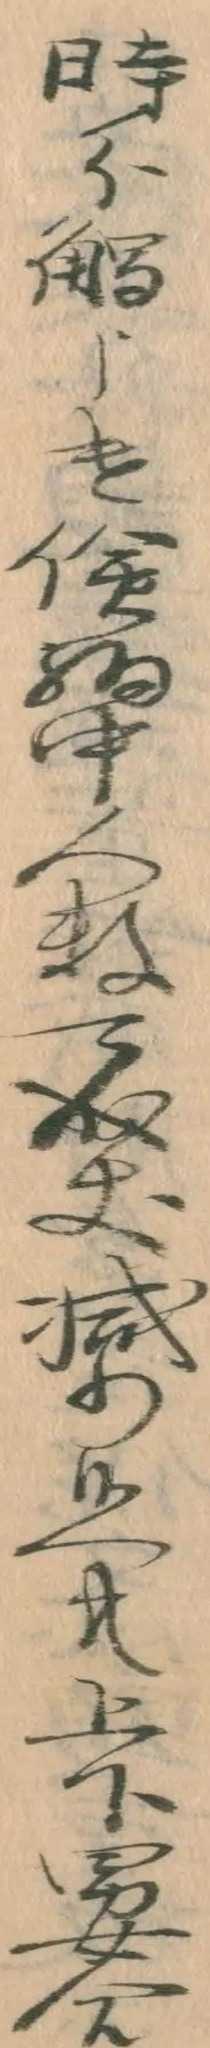時分触申遣倹約中人数可成丈減少候へ共上下男女合
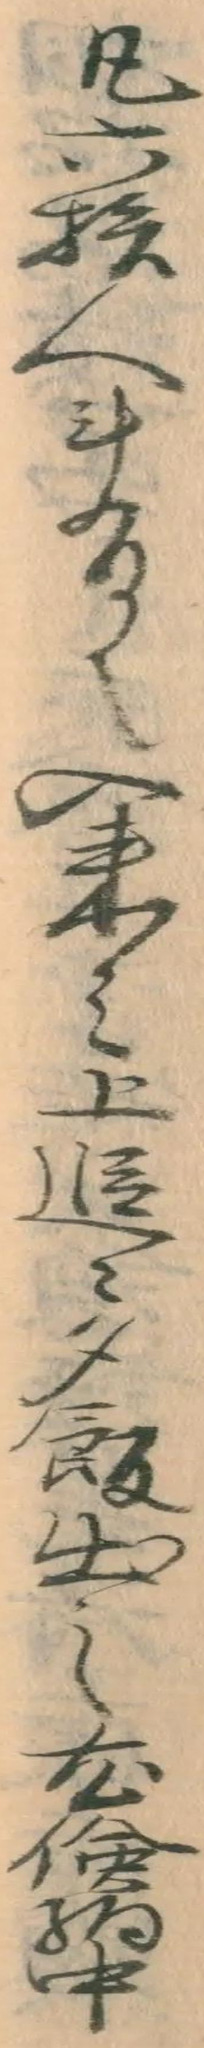凡六拾人斗有之入来之上追々夕飯出之尤倹約中
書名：賀茂社記録. 第72冊
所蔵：国立国会図書館 National Diet Library, JAPAN
